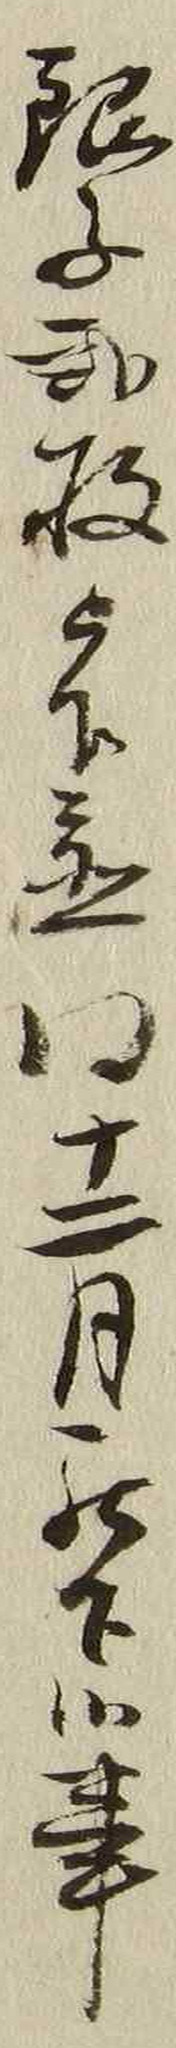銀子弐枚被下置同十二月罷下候事
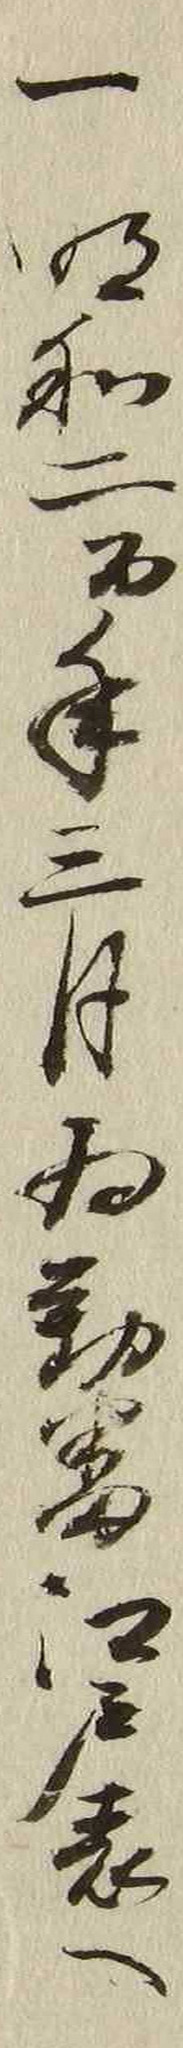一明和二酉年三月為勤番江戸表へ
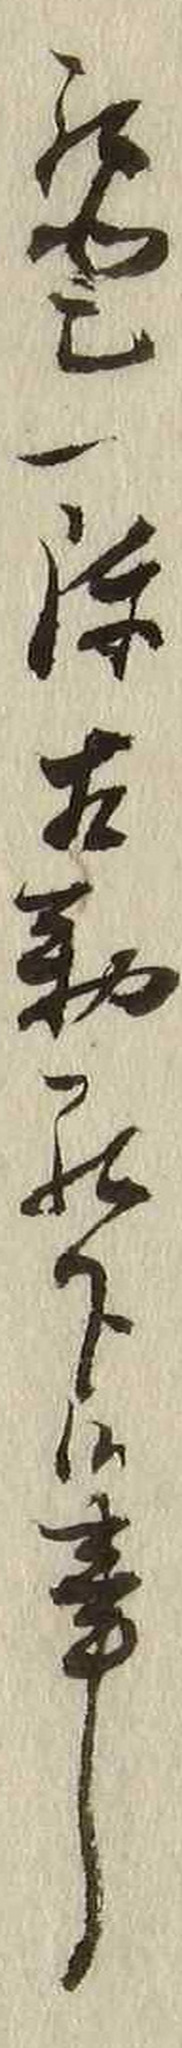罷登一陣相勤罷下候事
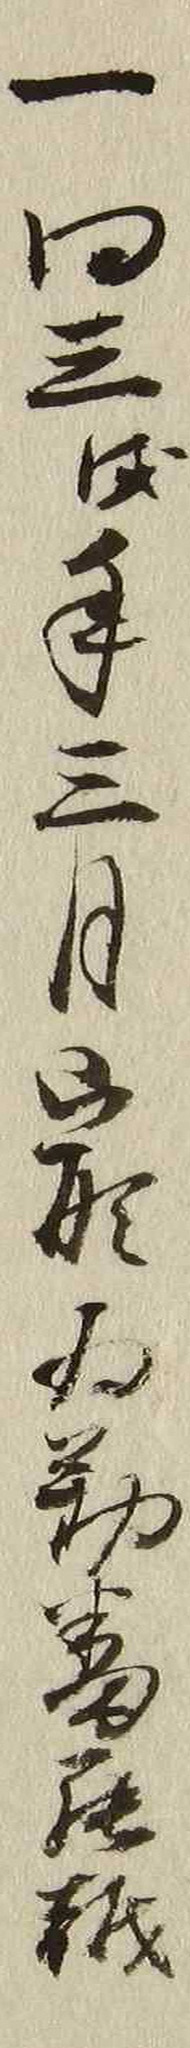一同三戌年三月山形為勤番罷越
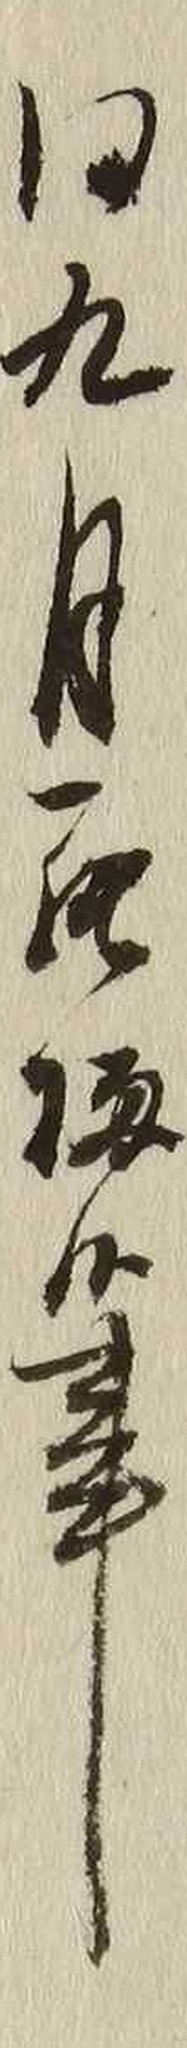同九月罷帰候事
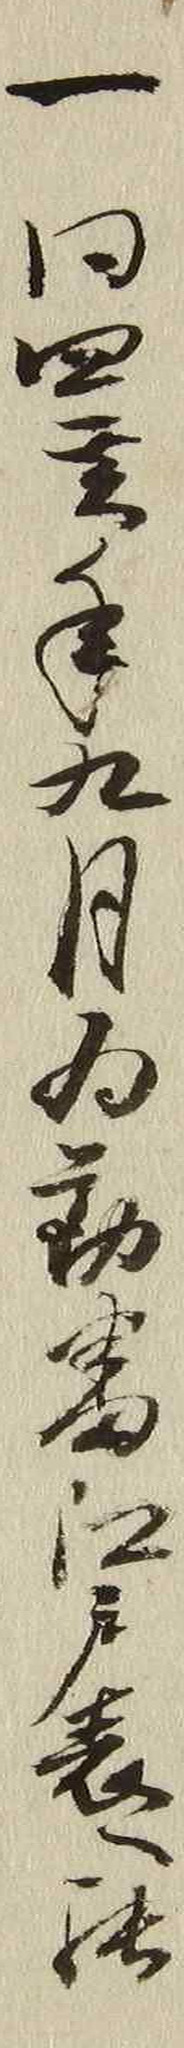一同四亥年九月為勤番江戸表へ罷
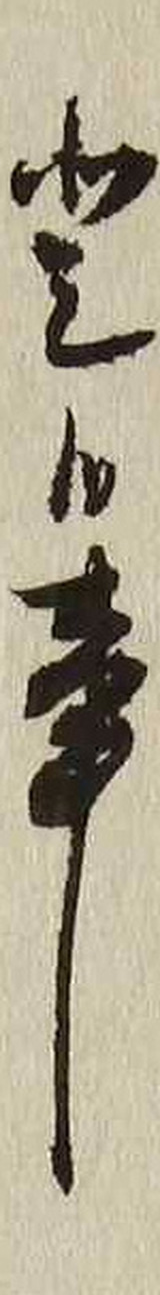登候事
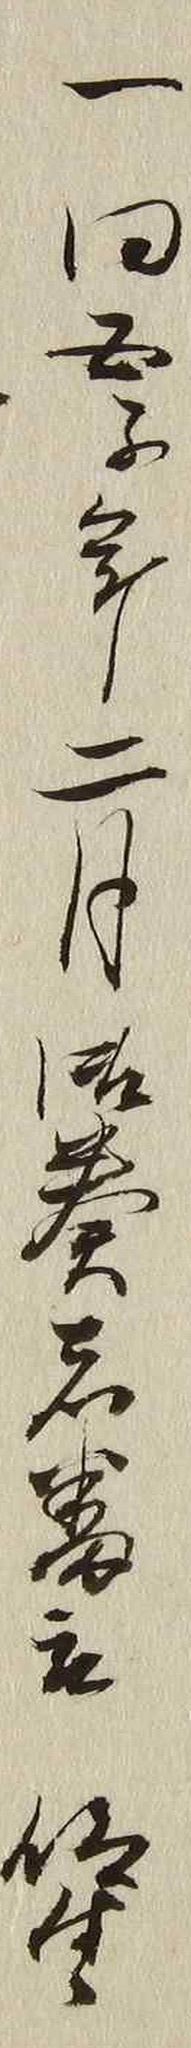一同五子年二月御奏者番被仰付候
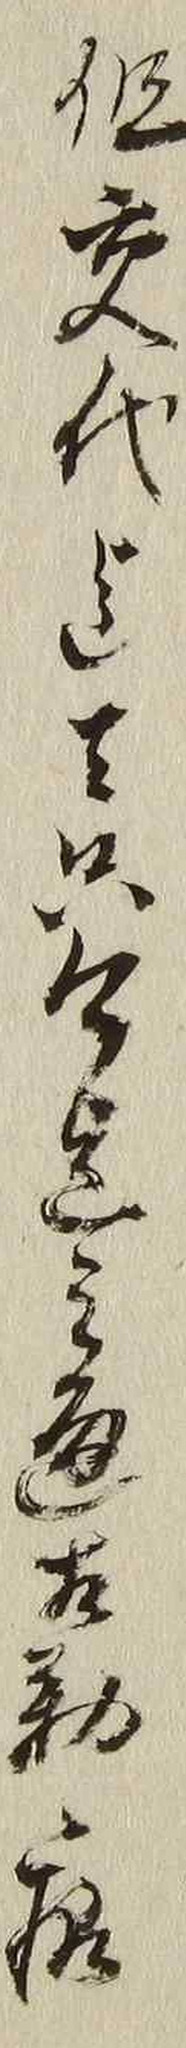但交代迄者只今迄之通相勤候様
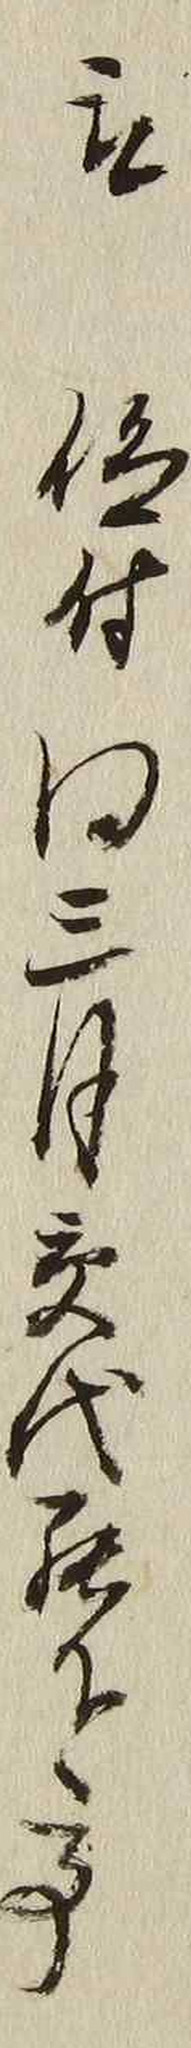被仰付同三月交代罷下候事
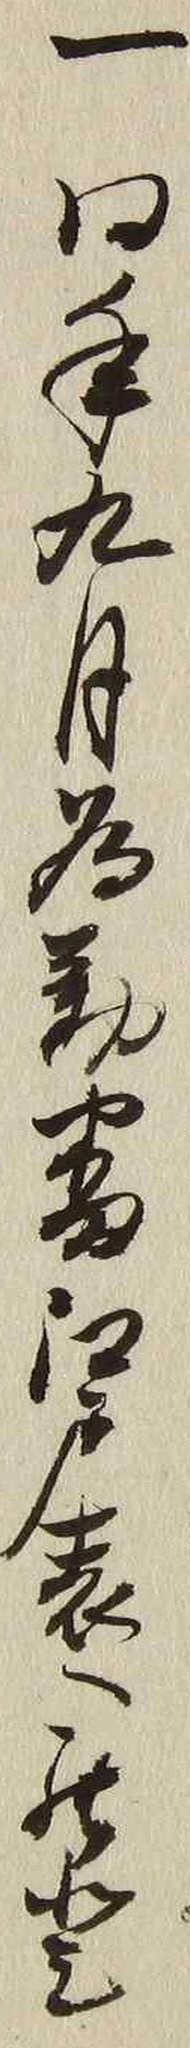一同年九月為勤番江戸表へ罷登
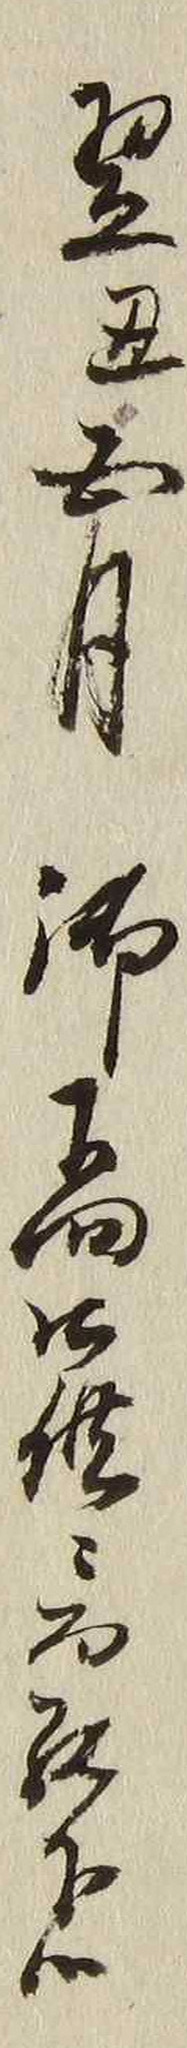翌丑五月御下向御供ニ而罷下候
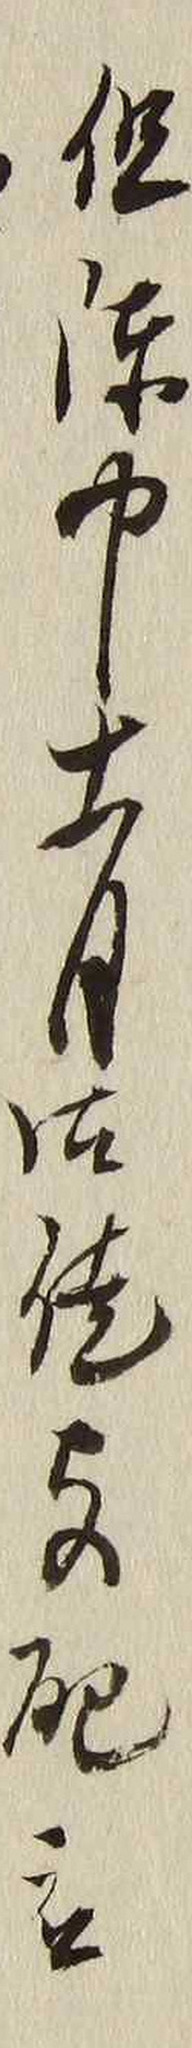但陣中十一月御徒支配被
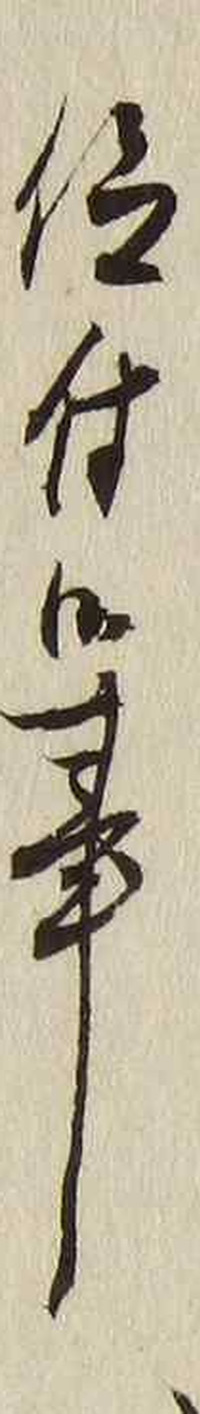仰付候事
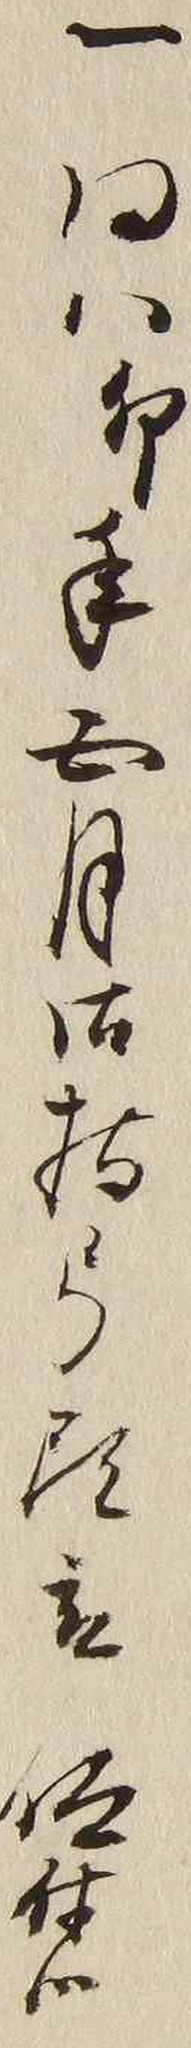一同八卯年五月御持弓頭被仰付候

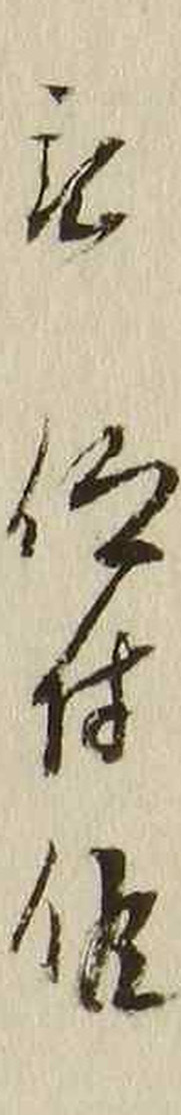被仰付候
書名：諸士系譜　巻之348　も之部4
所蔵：会津若松市立会津図書館
